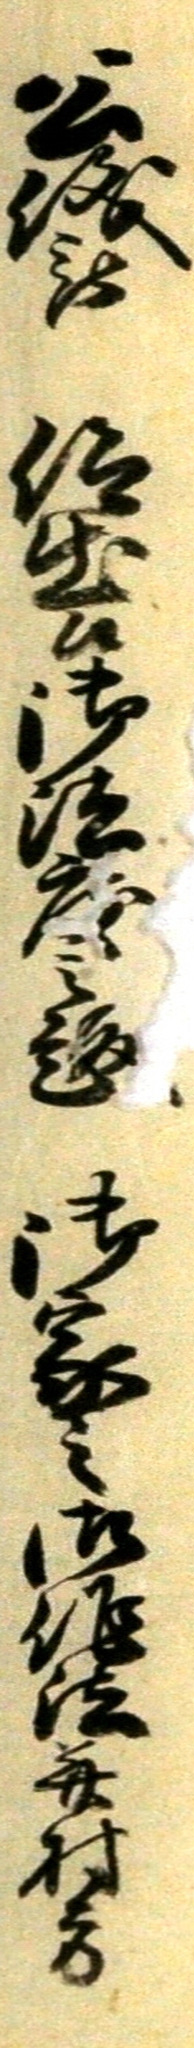公儀被仰出候御法度之趣御家之御作法幷村方
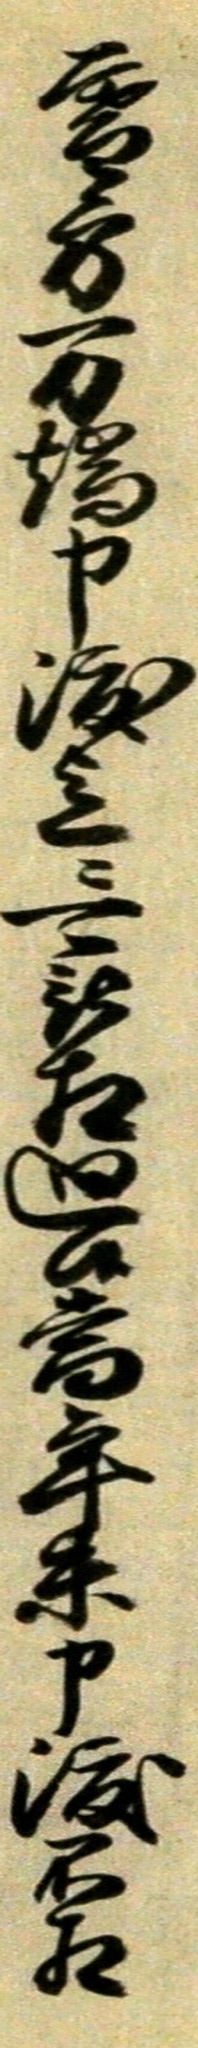暮方万端申渡迄ニ可被相廻候当年未申渡不相
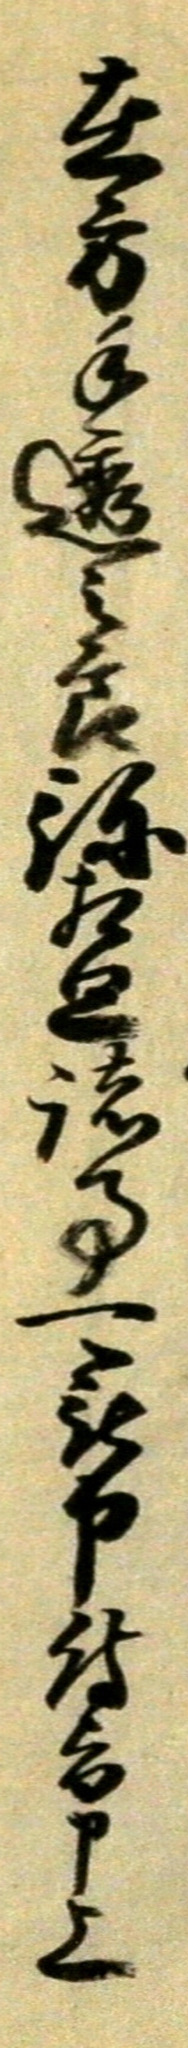在方手透之節弥相廻諸事可被申付旨申上
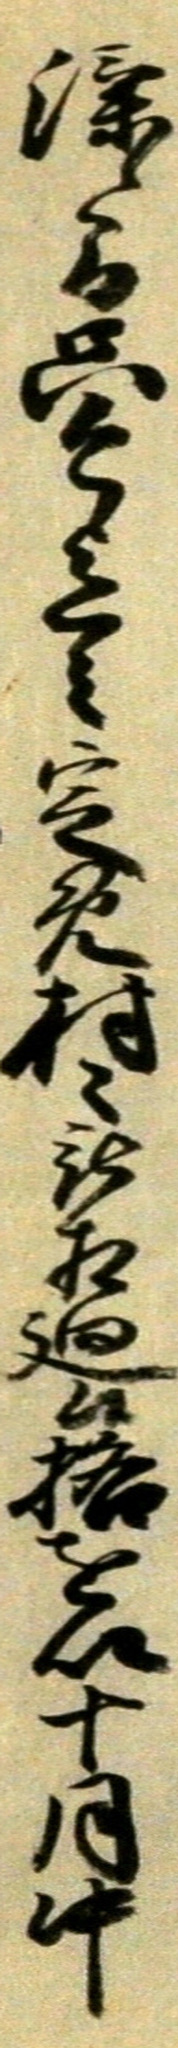済候間只今迄之定免村々被相廻候格を以十月中
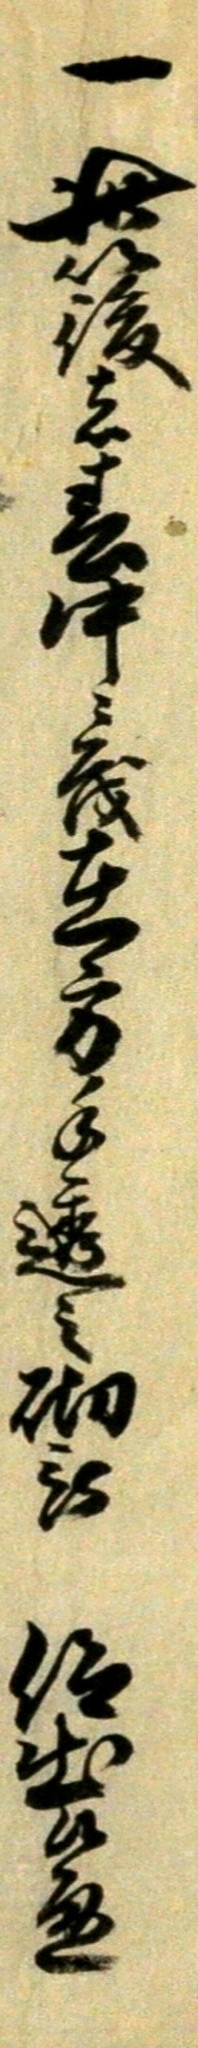一此以後者春中ニ茂在方手透之砌被仰出候通
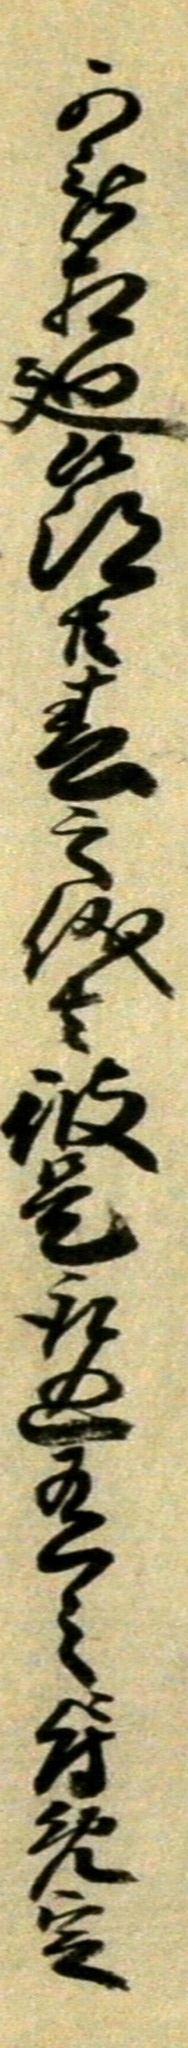可被相廻候得共春之儀者彼是取込有之ニ付免定
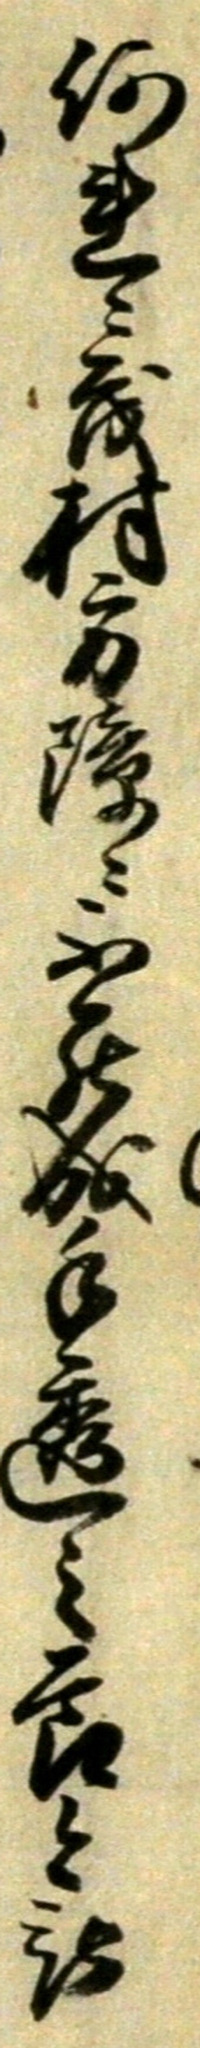何れに茂村方障ニ不罷成手透之節と被
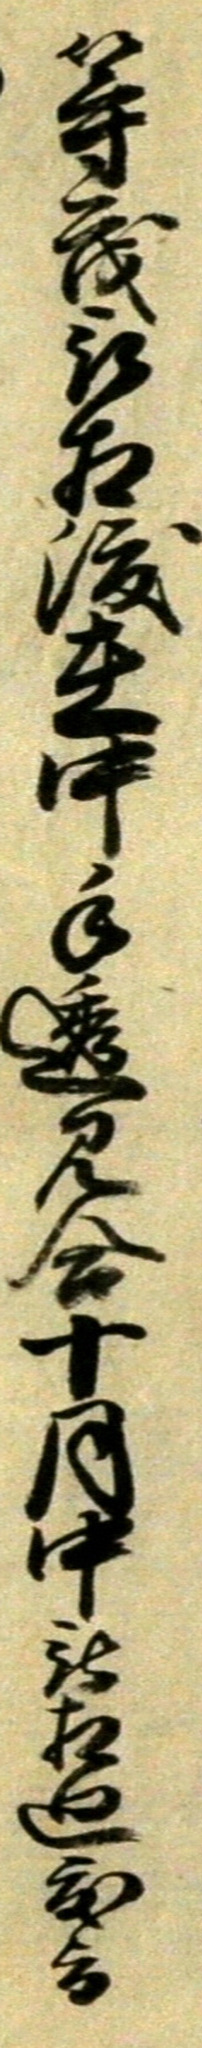等茂被相渡在中手透見合十月中被相廻度旨
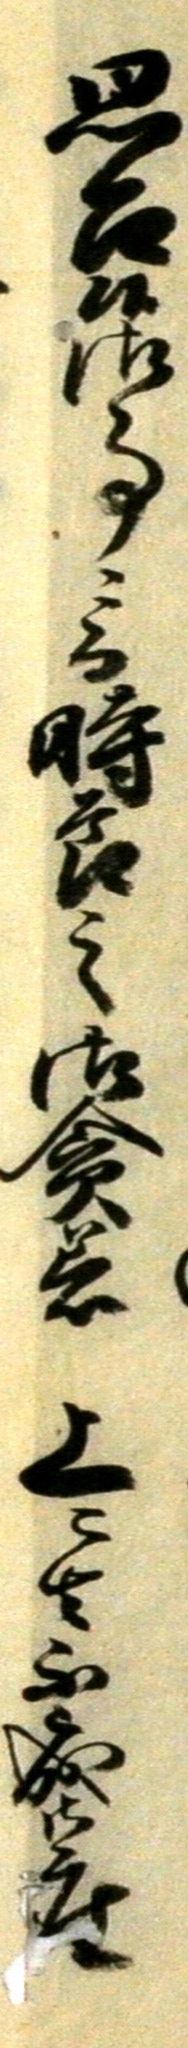思召候御事ニ而時節之御貪着上ニ者不被成御座
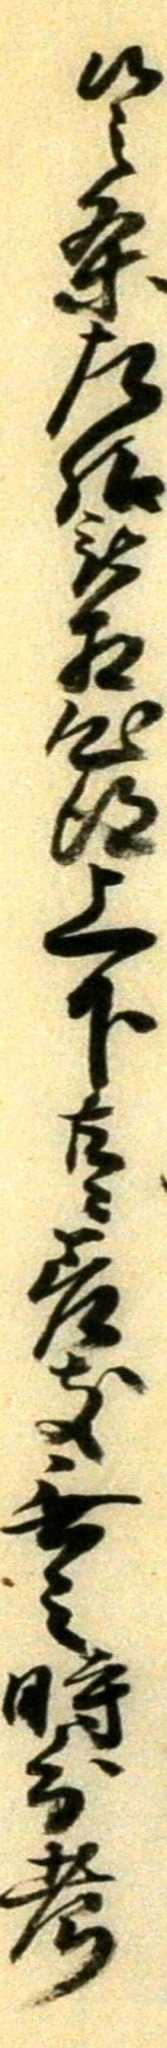候之条左様被相心得上下共ニ差支無之時分考
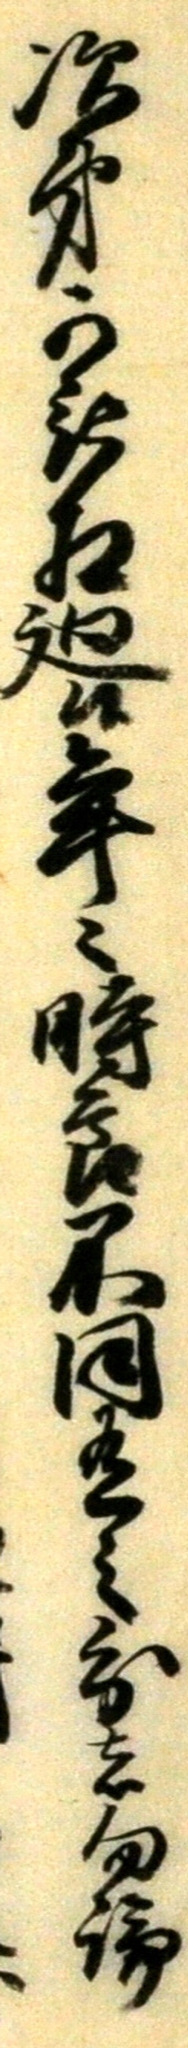次第可被相廻候年々時節不同有之分者勿論
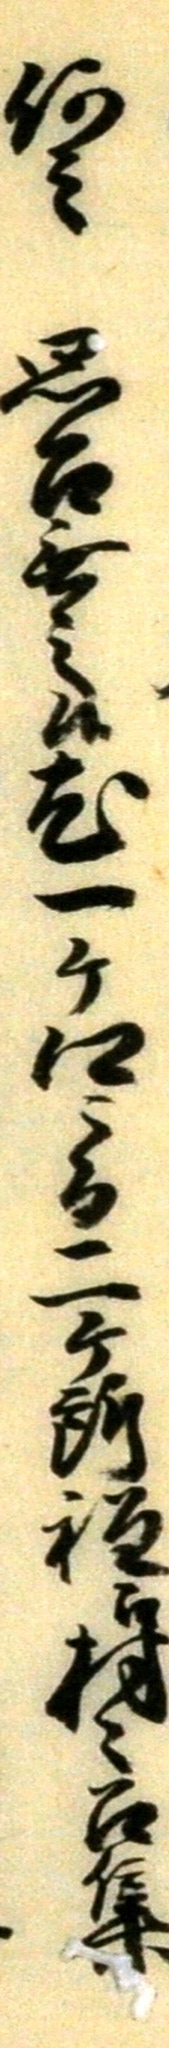何之思召無之候尤一ヶ郷ニ而二ヶ所程江村々召集
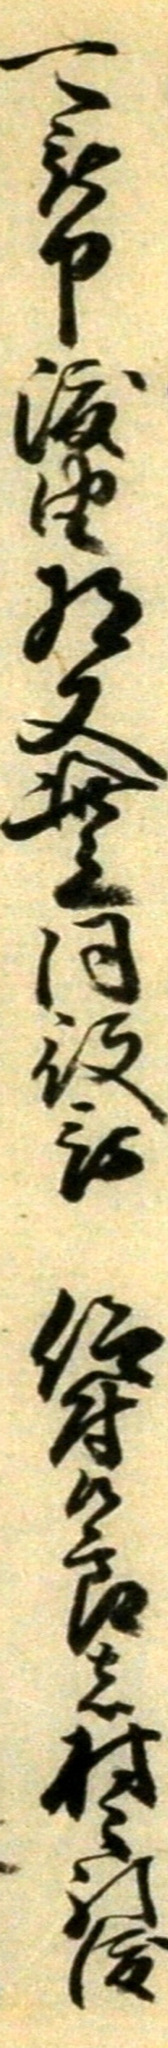可被申渡由将又此上同役被仰付候節者村々引渡
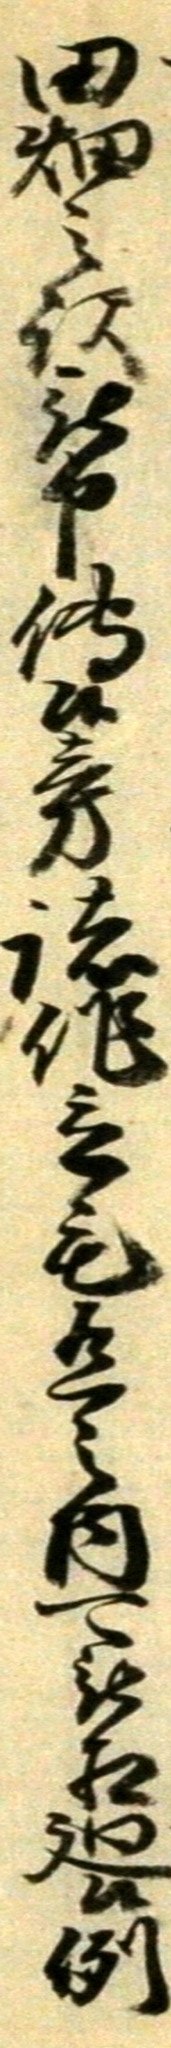田畑之訳被申伝候旁諸作立毛有之内可被相廻候例
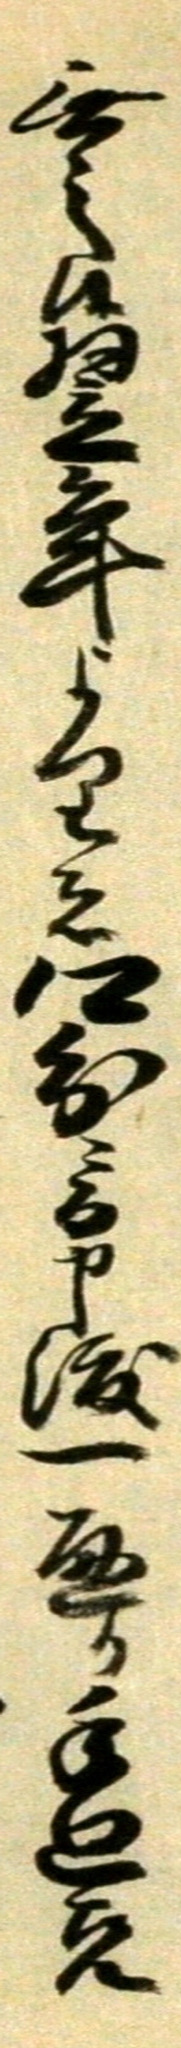無之候翌年より者郷分ニ而申渡一通り手廻克
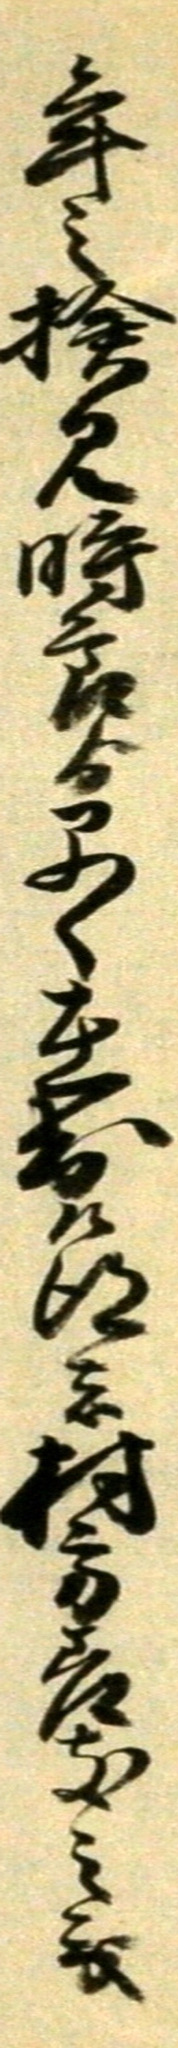年々検見時節ゟ早く在出候得者村方差支之義
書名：留書
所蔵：伊那市立高遠町図書館・合同会社AMANE
